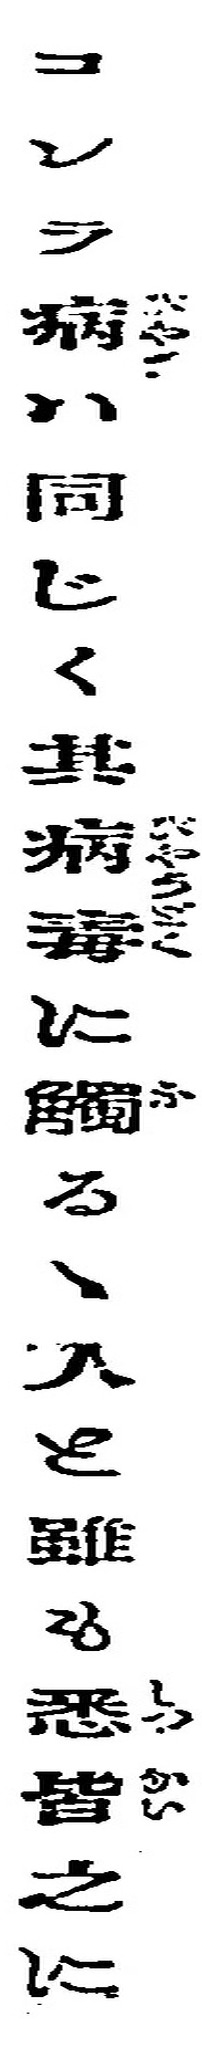コレラ病は同じく其病毒に触るゝ人と雖も悉皆之に
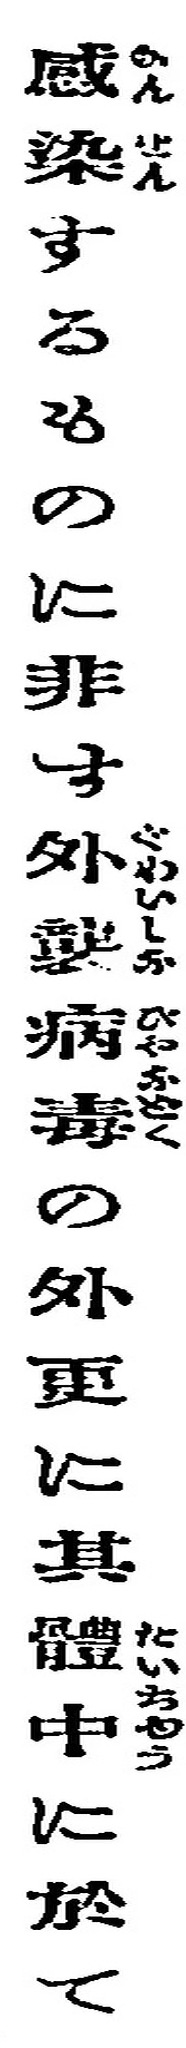感染するものに非す外襲病毒の外更に其体中に於て
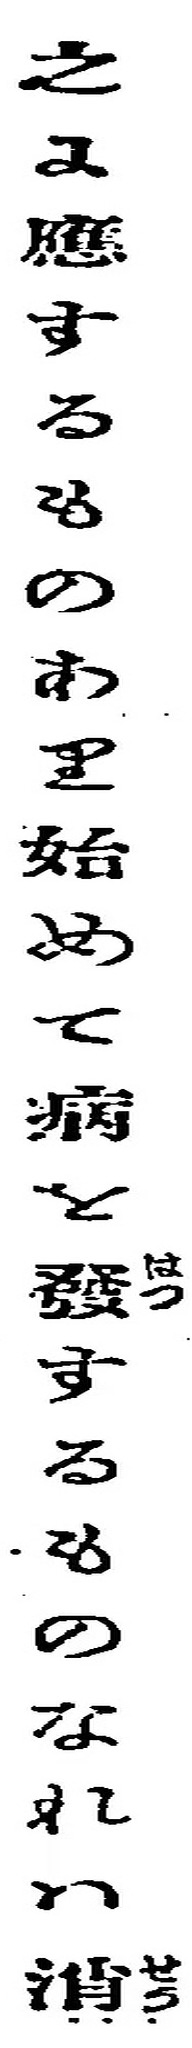之に応するものあり始めて病を発するものなれは消
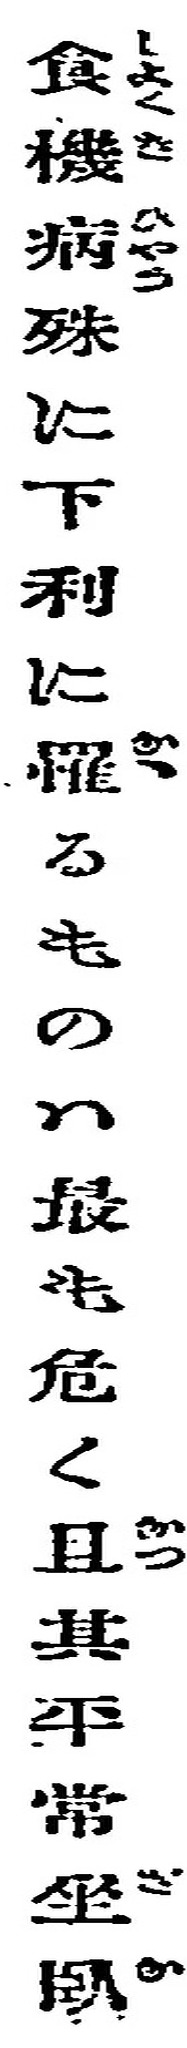食機病殊に下利に罹るものは最も危く且其平常坐臥
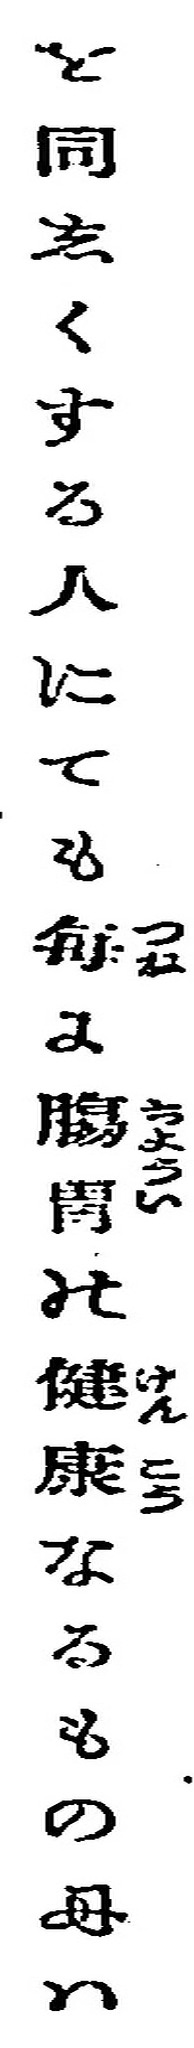を同しくする人にても毎に腸胃の健康なるものには
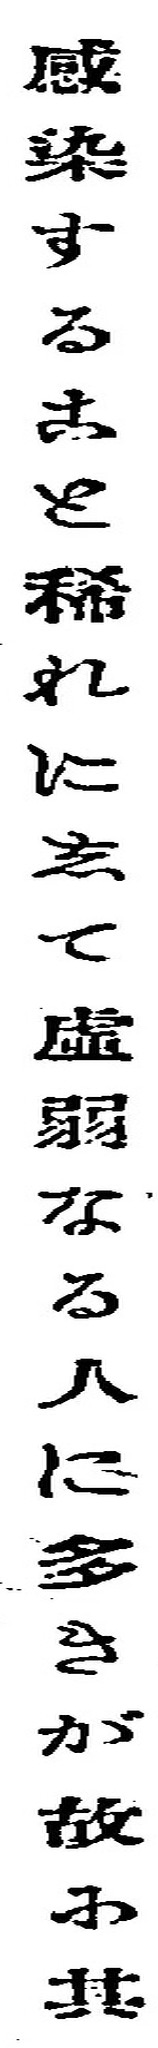感染すること稀れにして虚弱なる人に多きが故に其
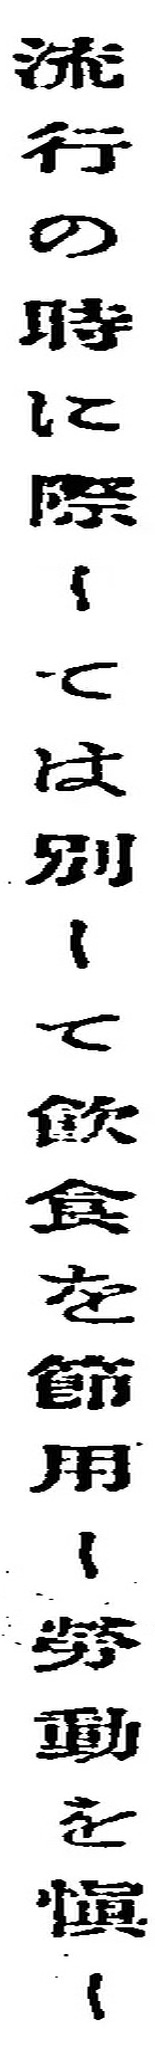流行の時に際しては別して飲食を節用し労動を慎し

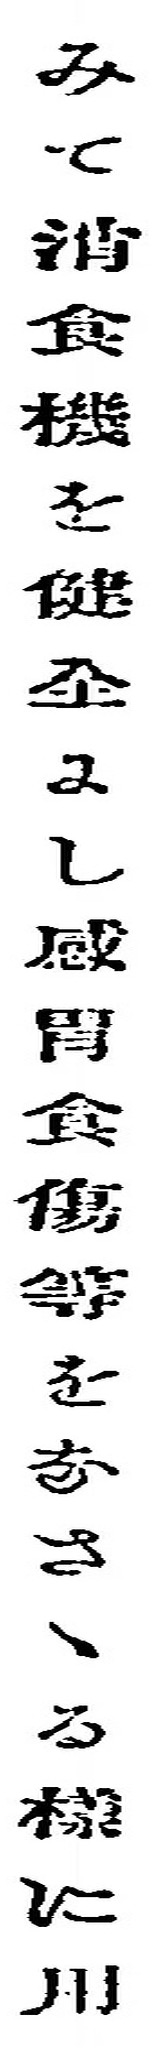みて消食機を健全にし感胃食傷等をなさゝる様に用
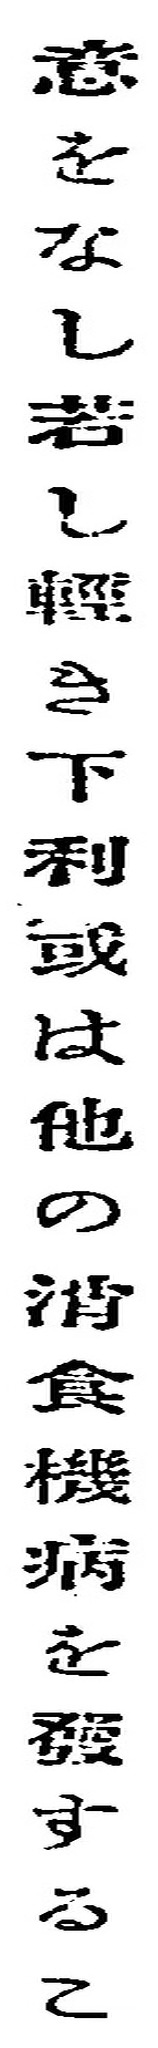意をなし若し軽き下利或は他の消食機病を発するこ
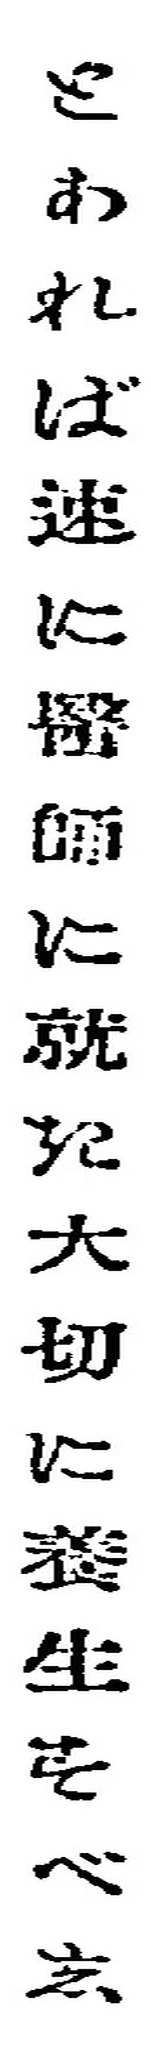とあれば速に医師に就き大切に養生すべし
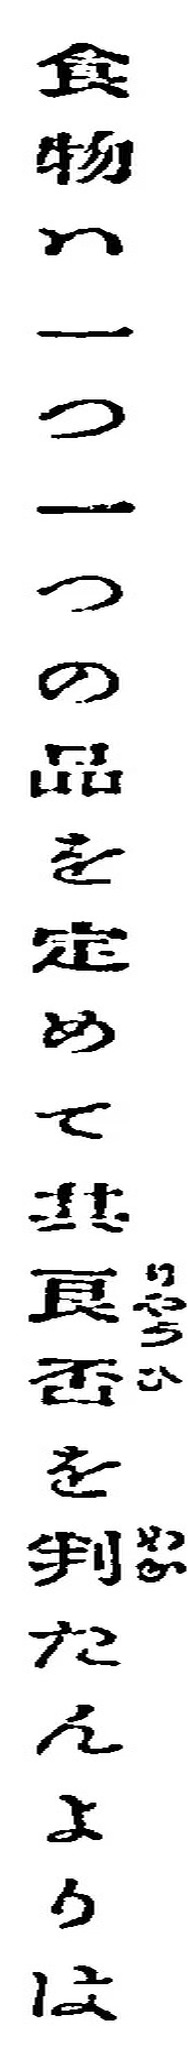食物は一つ一つの品を定めて其良否を判たんよりは
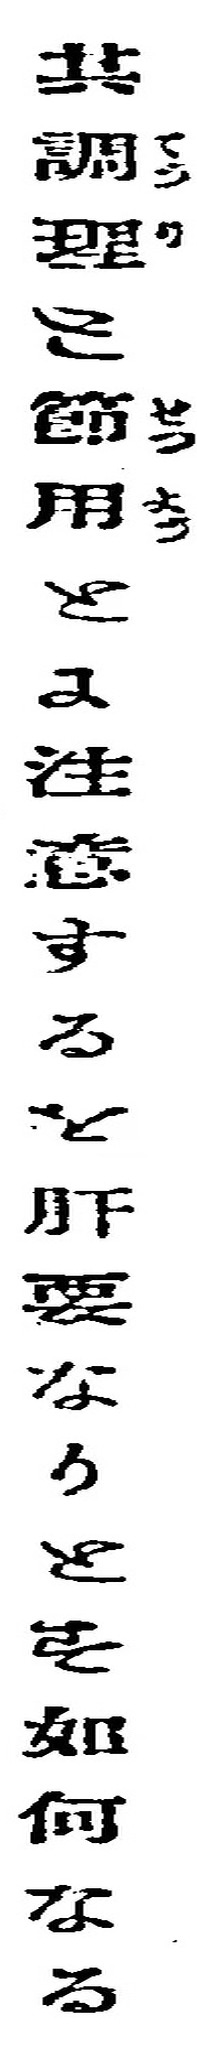其調理と節用とに注意するを肝要なりとす如何なる
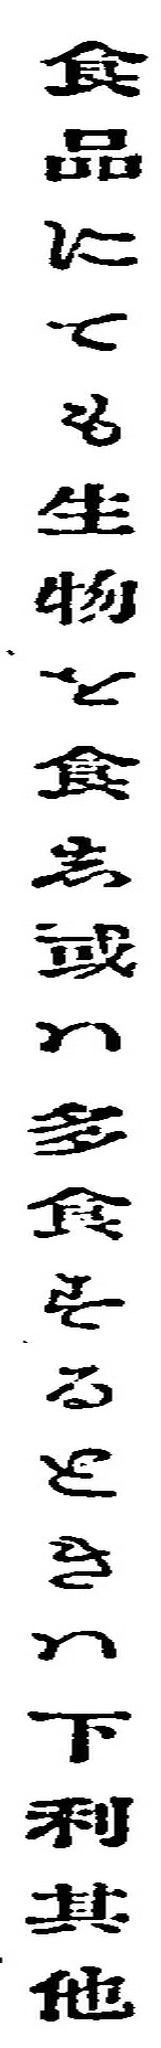食品にても生物を食し或は多食するときは下利其他
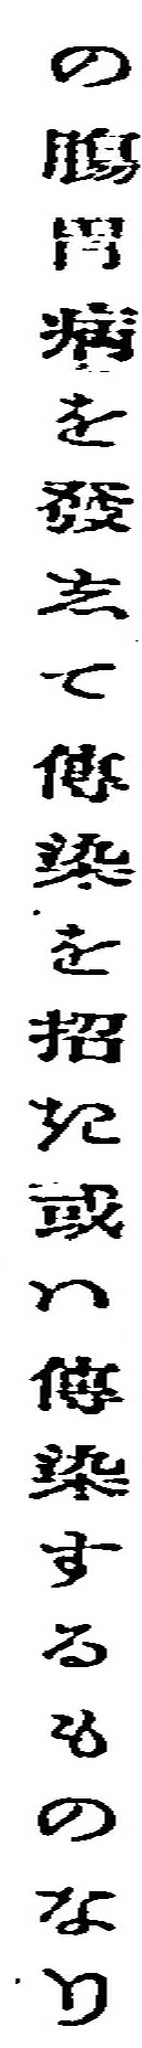の腸胃病を発して伝染を招き或は伝染するものなり
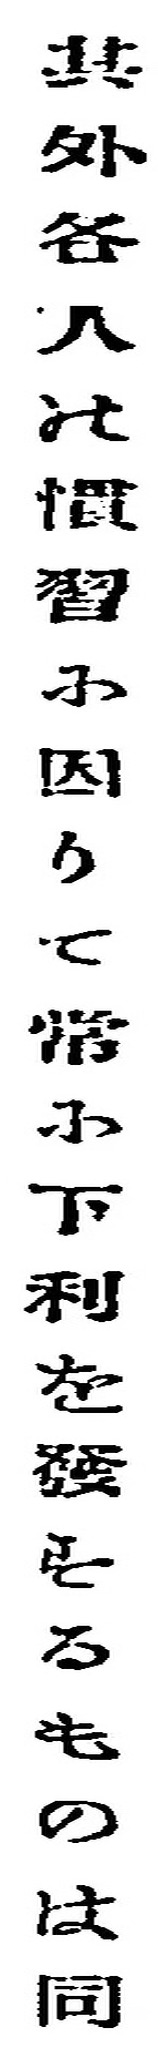其外各人の慣習に因りて常に下利を発するものは同
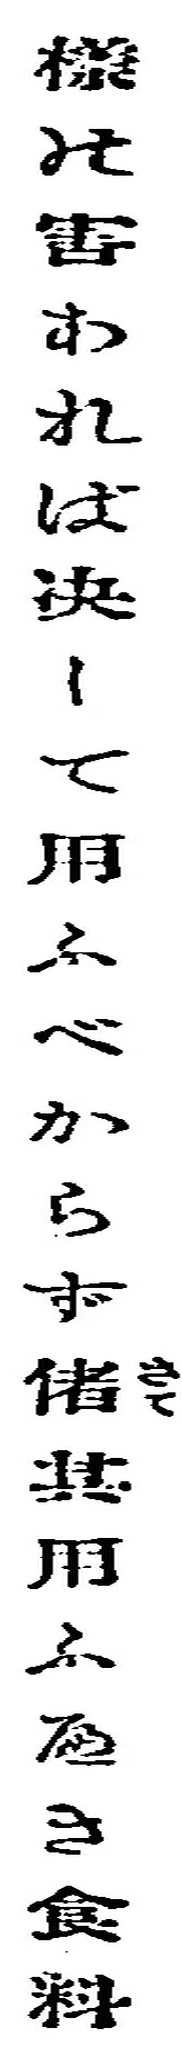様の害あれば決して用ふべからず偖其用ふへき食料
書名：これら病予防心得
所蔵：国立国会図書館 National Diet Library, JAPAN
